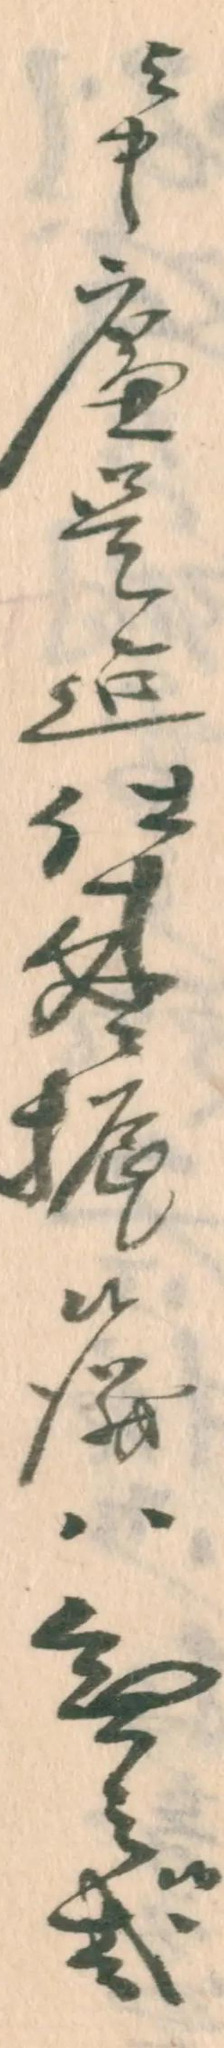と申廉是迄仕来ニ振レ候儀は無之候哉
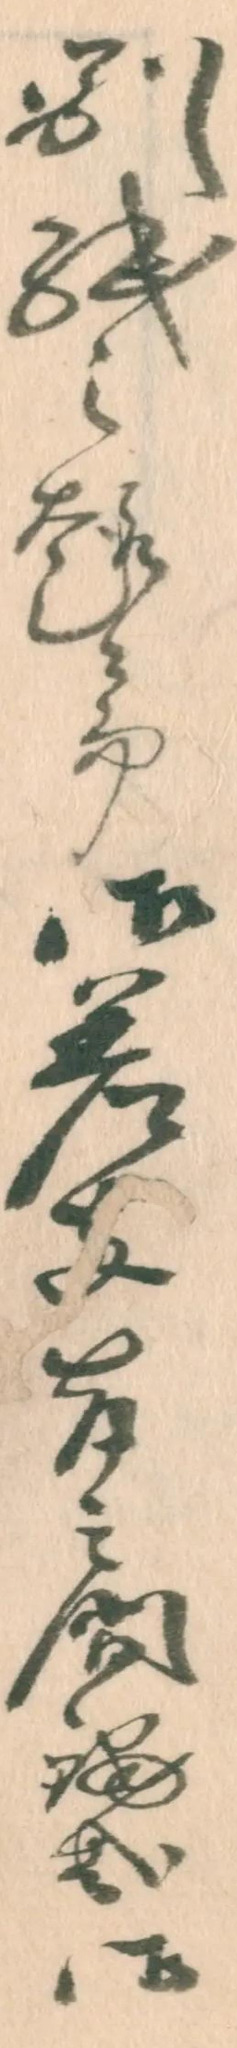別紙之趣ニ而御差支有之間鋪哉御
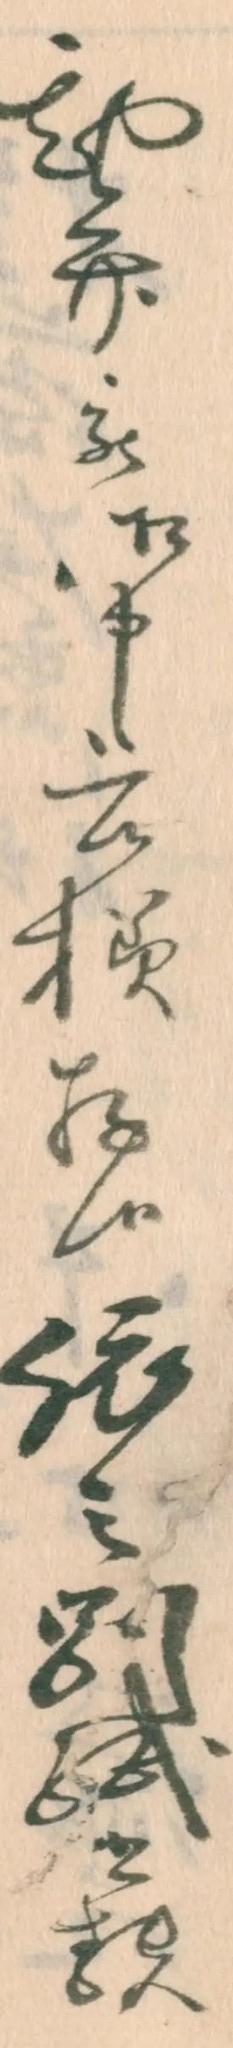勘弁被御申上候様存候依之別紙書類
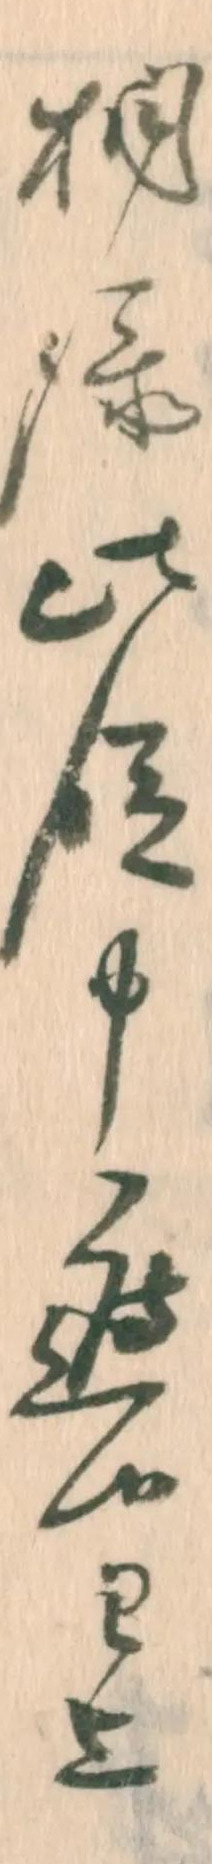相添此段申進候已上
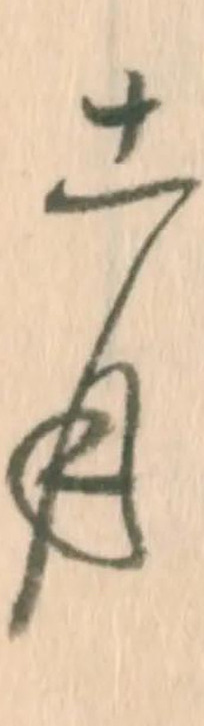十一月
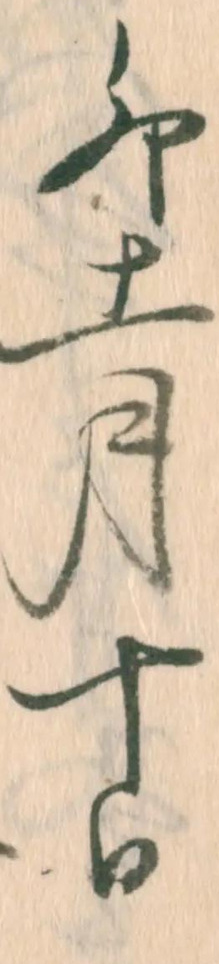卯十一月十日
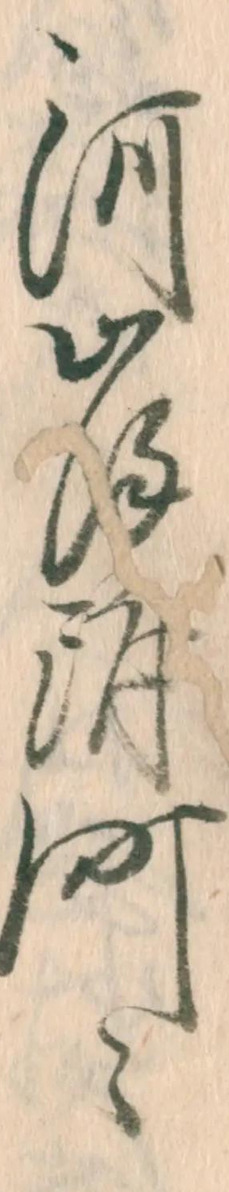河岸附町々
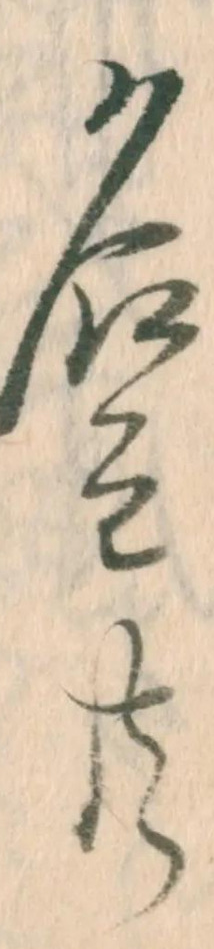名主共
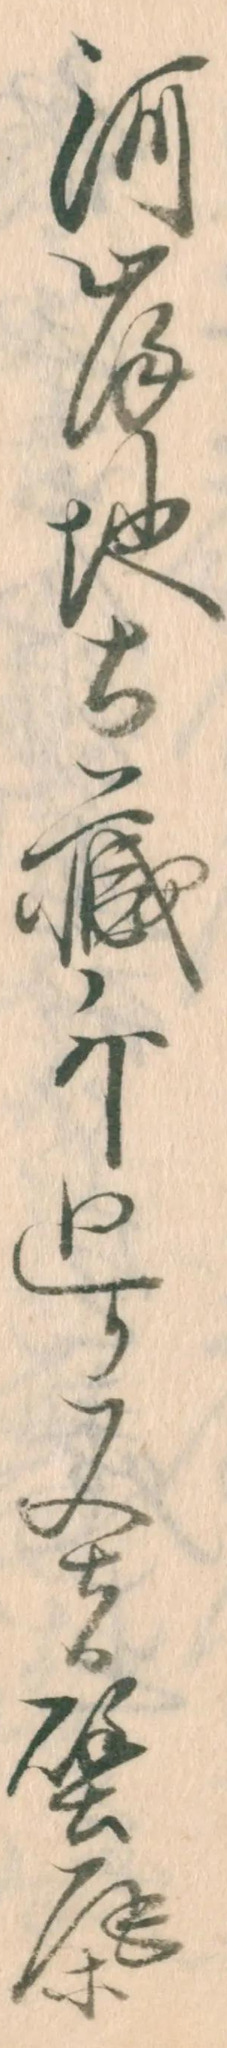河岸地土蔵外廻リ又は壁瓦等
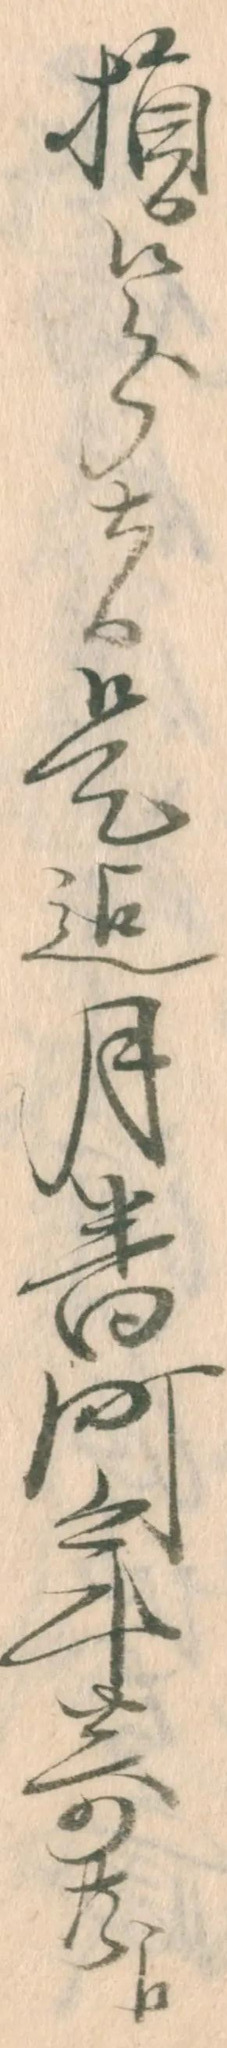損候分は是迄月番町年寄共え

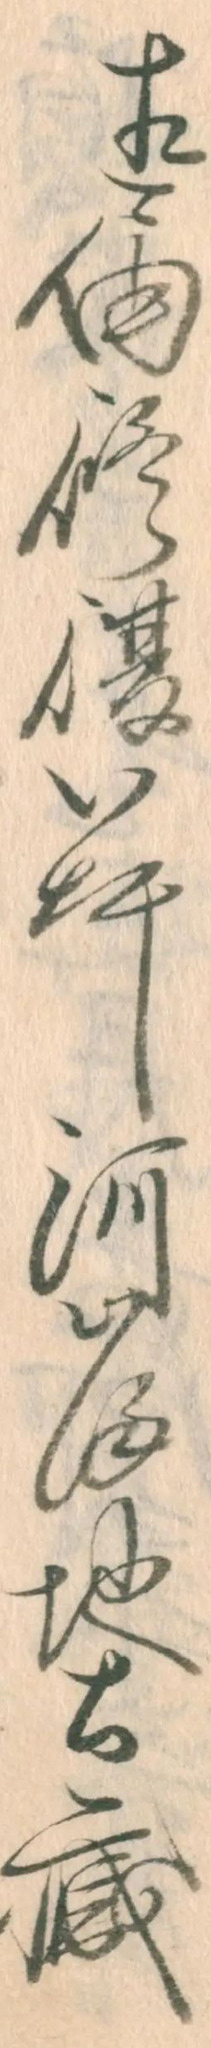相届修復いたし河岸地土蔵
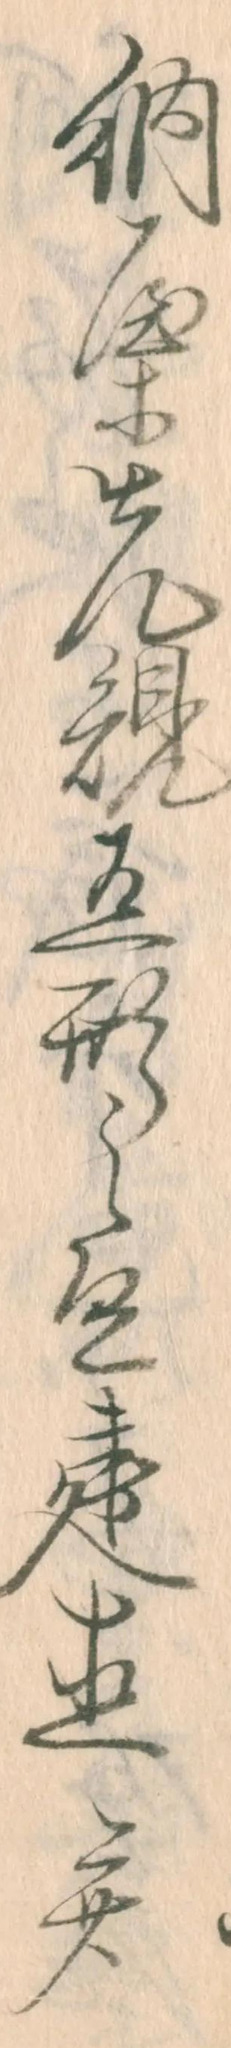納屋等先規有形之通建直幷
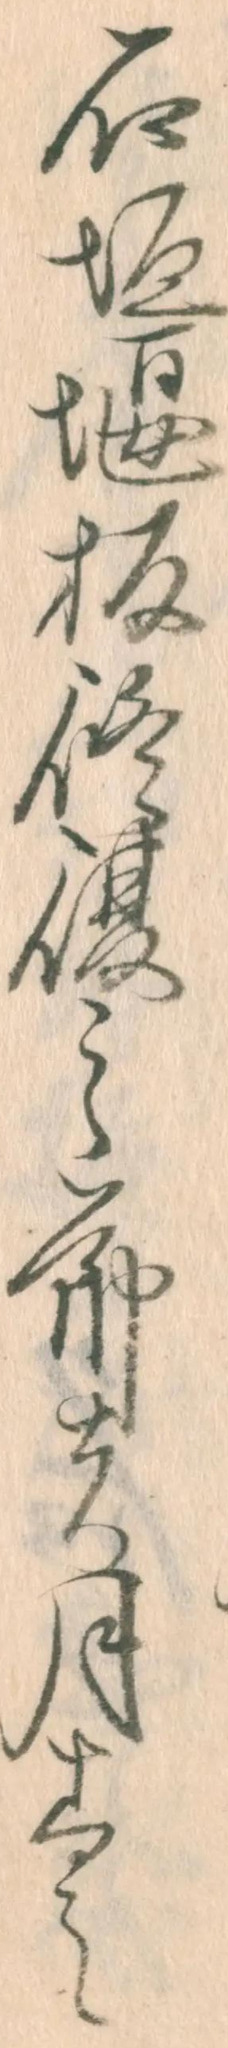石垣堰板修復之節は月十日之
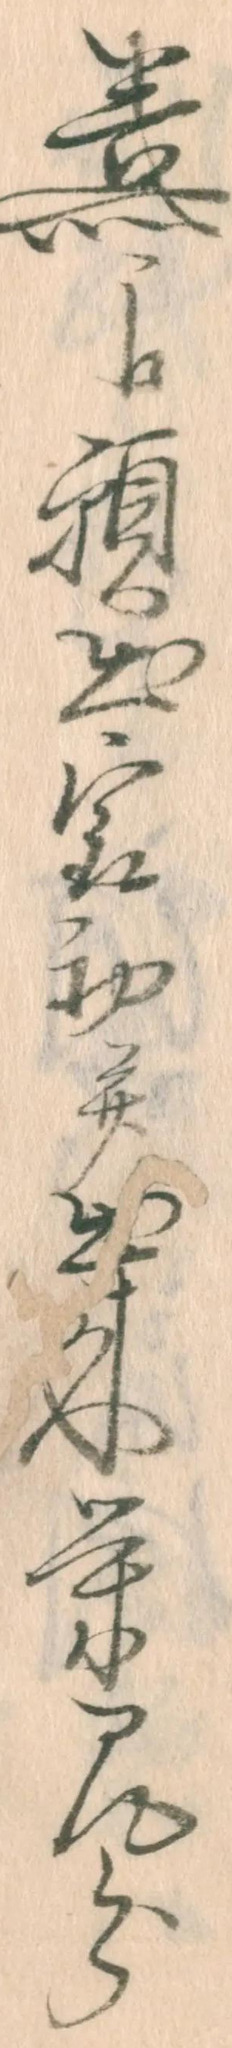番所え願出最初幷出来栄見分
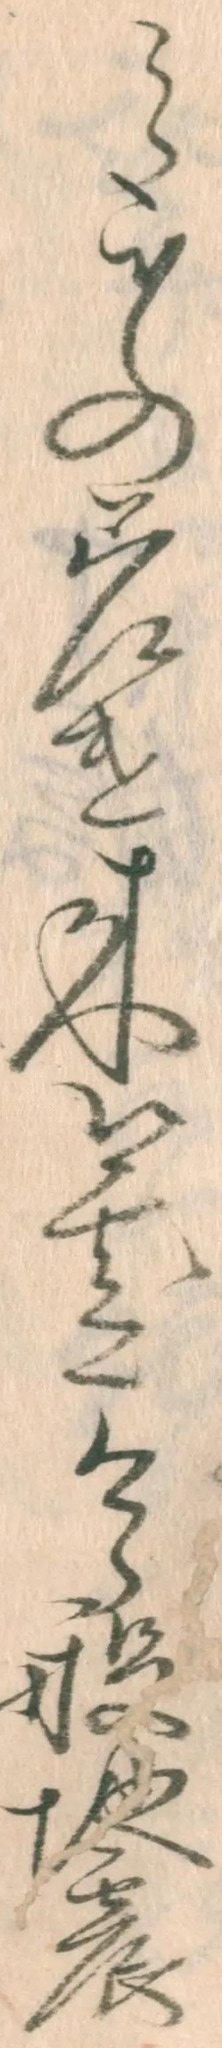之もの差遣来候処今般地震
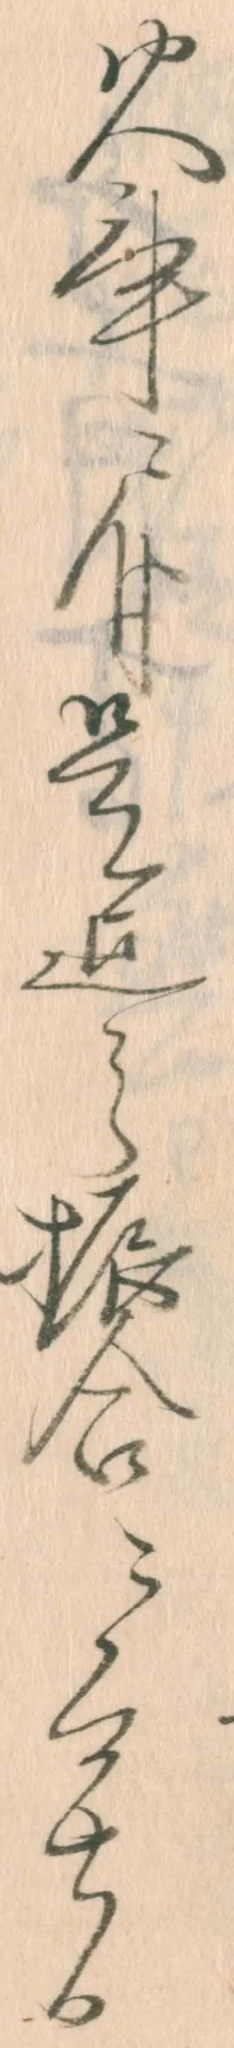火事ニ付是迄之振合ニ而は
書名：地震災書留 2巻. [1] 内表紙に「地震災書留　安政二卯年　但本所深川御用屋敷地代免除調」とあり
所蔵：国立国会図書館 National Diet Library, JAPAN
